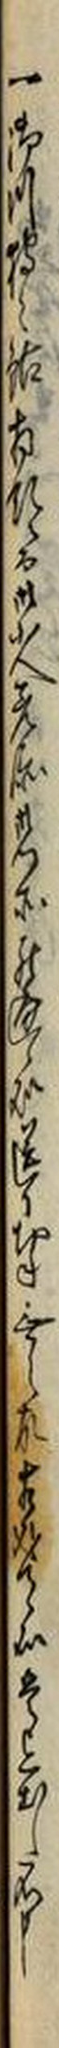一御川狩之鮎拝領に而御小人差添御門所罷通候処送り切手無之故相咎候処迄出し不申
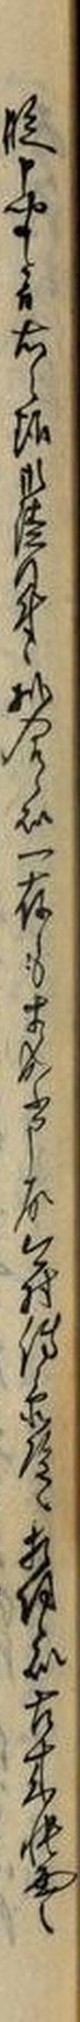段申聞候付右之趣御徒目付へ掛合候処一存にも相成不申故今村伝兵衛殿へ相伺候処古来帳面之
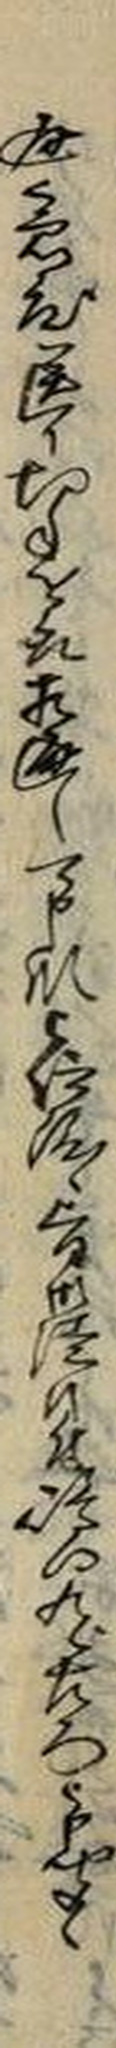通急度送り切手を取相通し可申候段被仰渡旨御徒目付嶋田九郎左衛門被申聞候
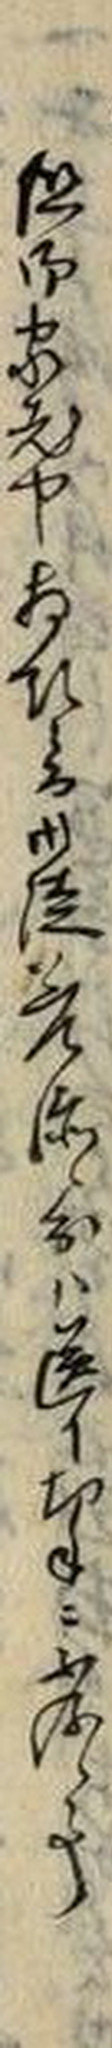但御家老中拝領に而御徒差添候分は送り切手に不及候事
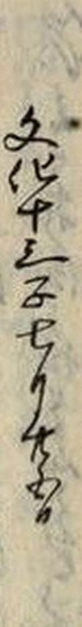文化十三子七月廿五日
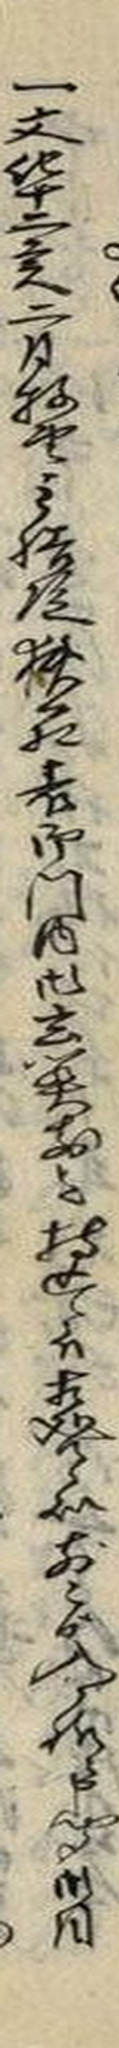一文化十二亥二月牧野主膳殿獄死者御門内御玄関前迄持込候に付相咎候処前々ゟ入候様被申聞御目
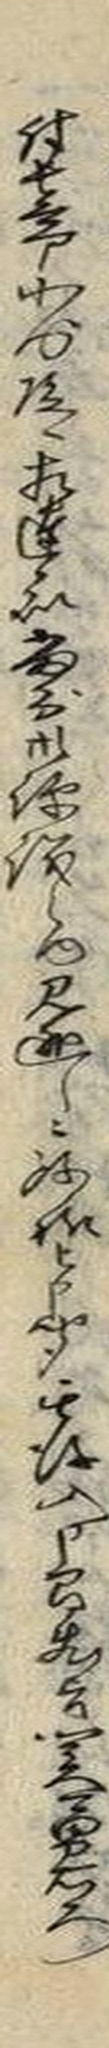付長谷部小右衛門殿へ相達候処当分御評議之内見逃しに致候様被申聞其後入申間敷旨関勇右衛門
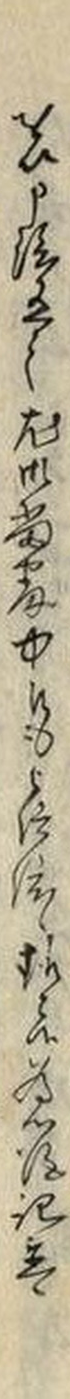を以申談有之尤御当番中江も被仰渡候趣に候為心得記置候
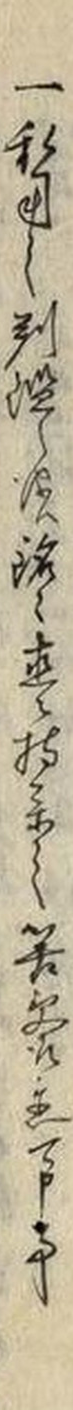一私用之判鑑之儀は銘々直々持参之筈受取置可申事
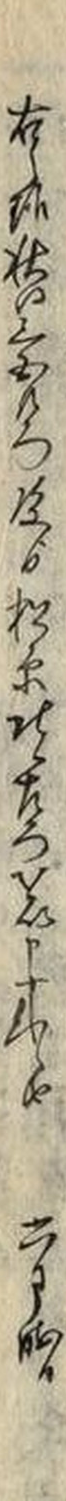右之趣秋田三五左衛門殿ゟ松原次郎左衛門を以申来候六月晦日
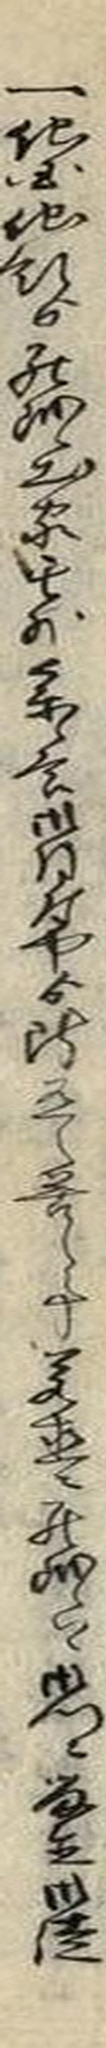一他国他領ゟ罷越候出家其外参候節御目付中ゟ断有之筈之事若直々罷越候はゝ御門に留置御徒
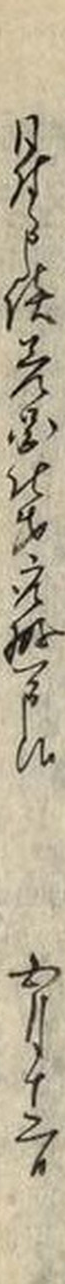目付へ申談差図次第取扱可申候五月十二日
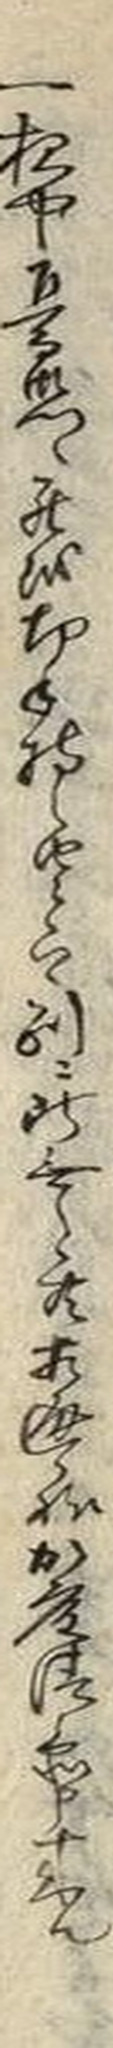一夜中下馬御門へ罷越切手持之由に候はゝ別に断無之候共相通候様加藤清兵衛申来ル
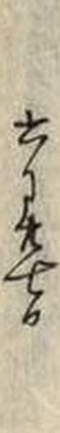六月廿七日
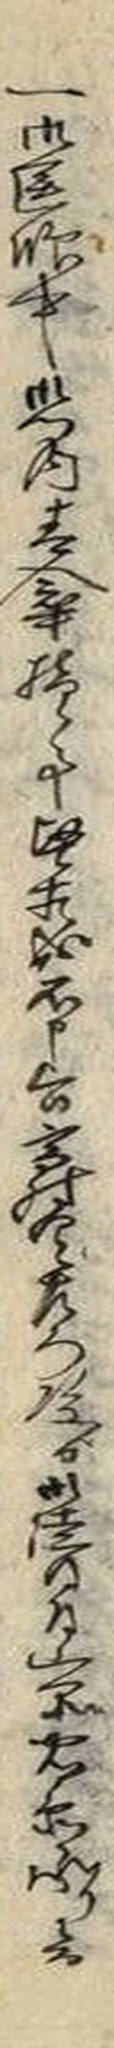一御医師中御門内青傘指候事堅相成不申旨高村四郎左衛門殿ゟ御徒目付山品忠兵衛承りに而
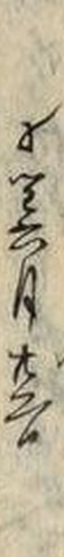六月廿七日
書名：御門御櫓之部
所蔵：福井県文書館 Fukui Prefectural Archives
